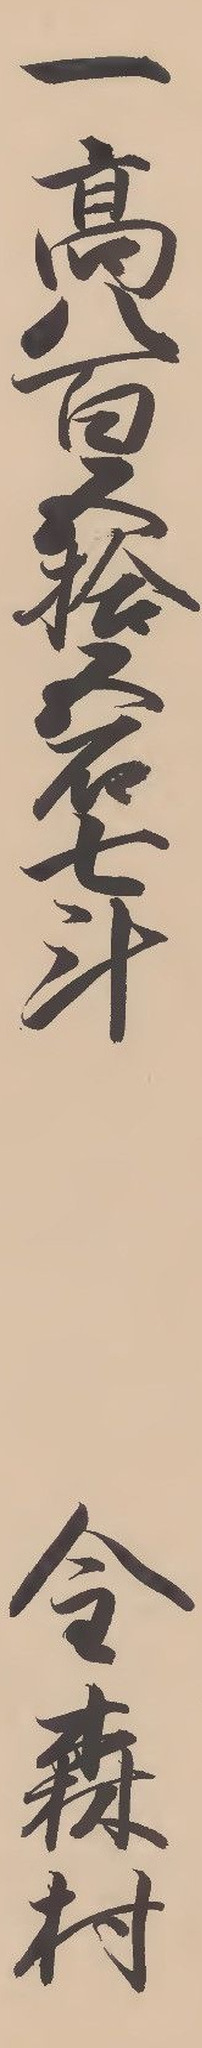一高八百五拾五石七斗金森村
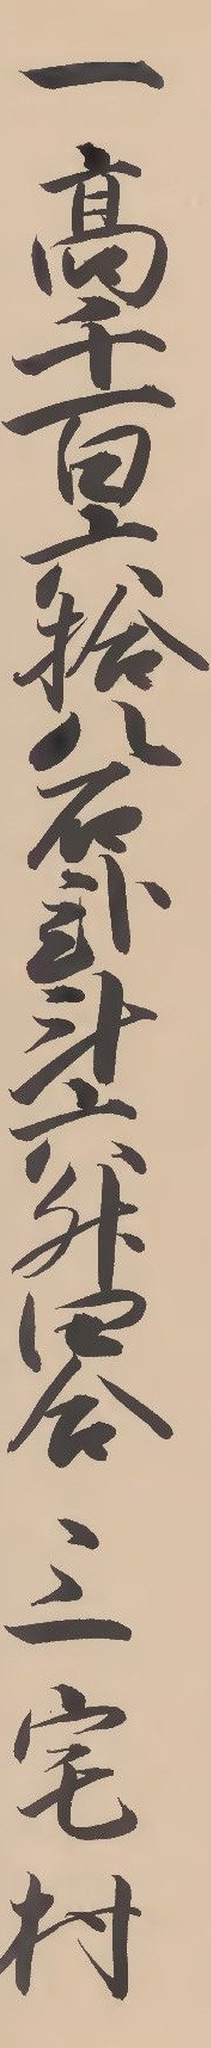一高千百六拾八石弐斗六升四合三宅村
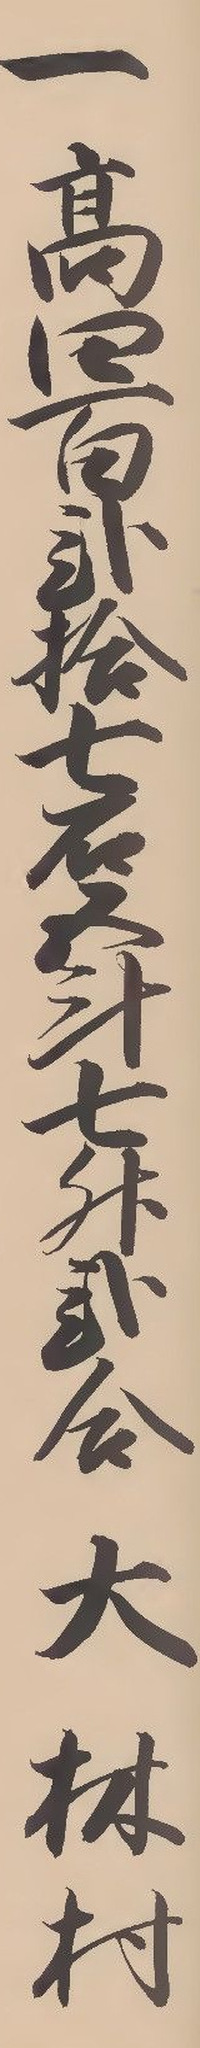一高四百弐拾七石五斗七升弐合大林村
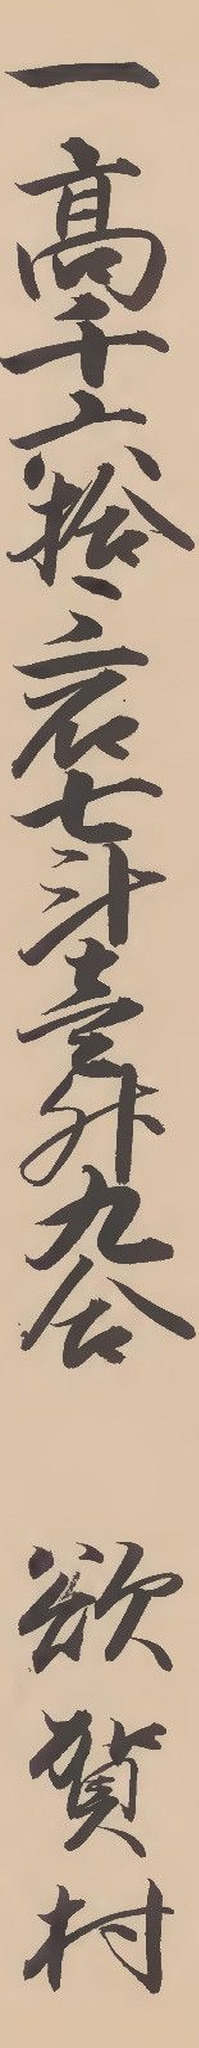一高千六拾三石七斗壱升九合欲賀村
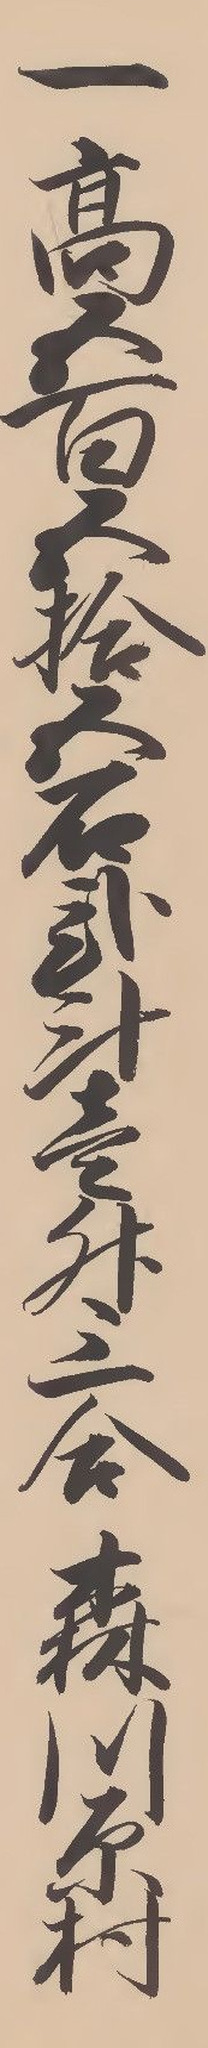一高五百五拾五石弐斗壱升三合森川原村
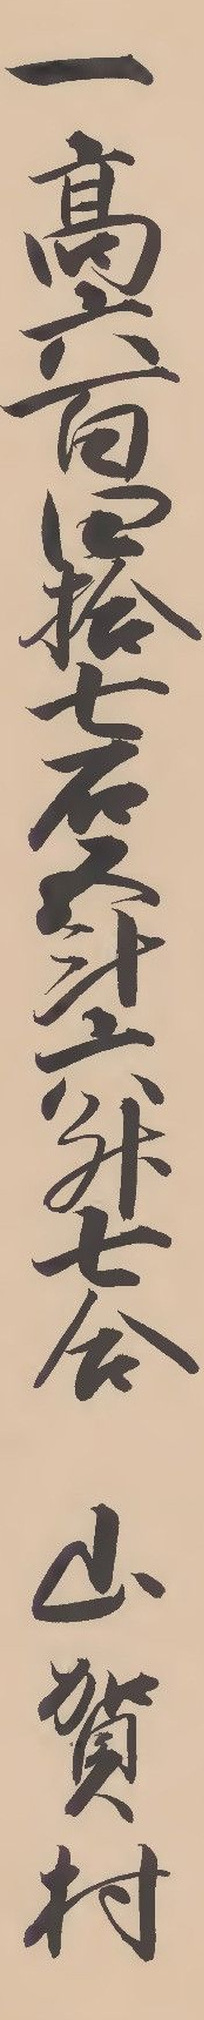一高六百四拾七石五斗六升七合山賀村

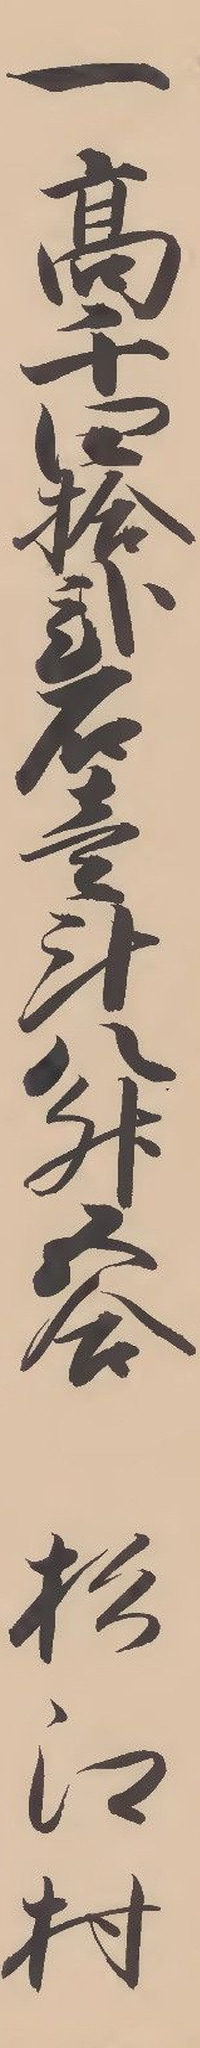一高千四拾弐石壱斗八升五合杉江村
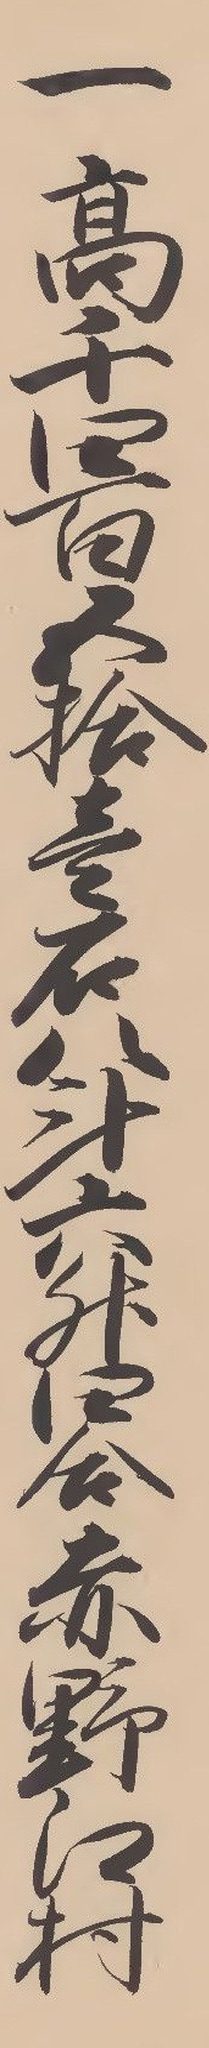一高千四百五拾壱石八斗六升四合赤野江村
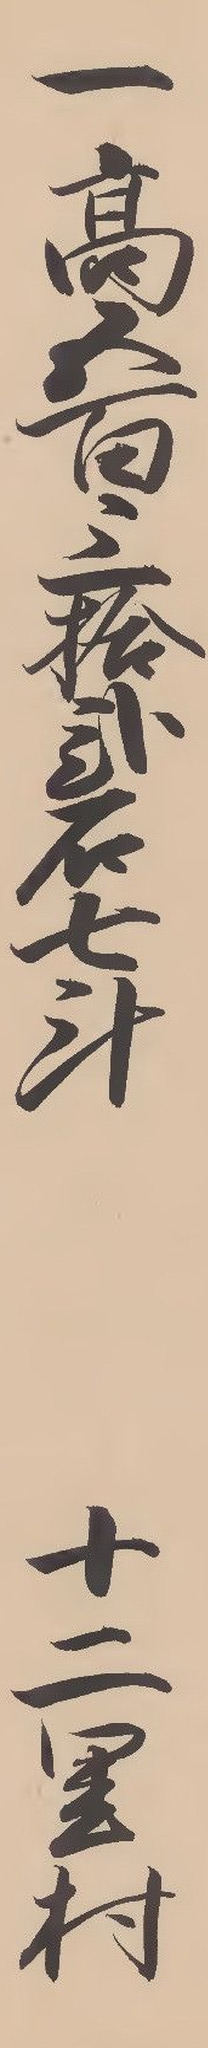一高五百三拾弐石七斗十二里村
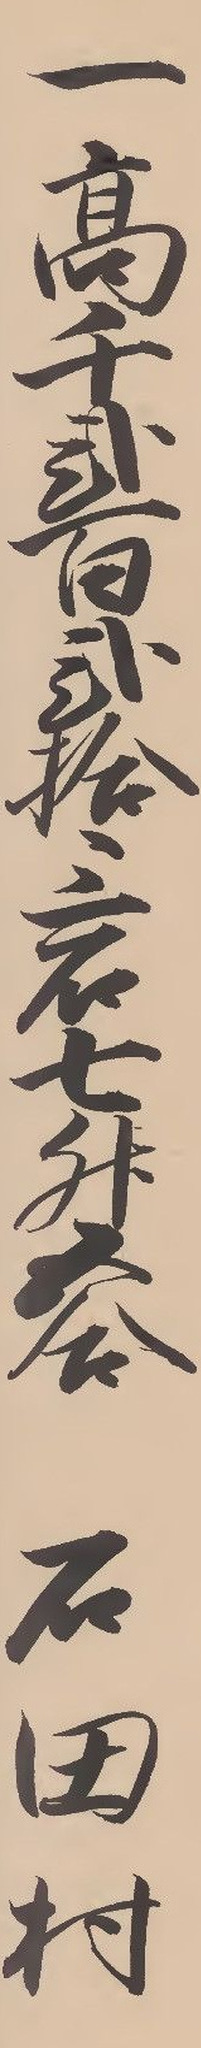一高千弐百弐拾三石七升五合石田村
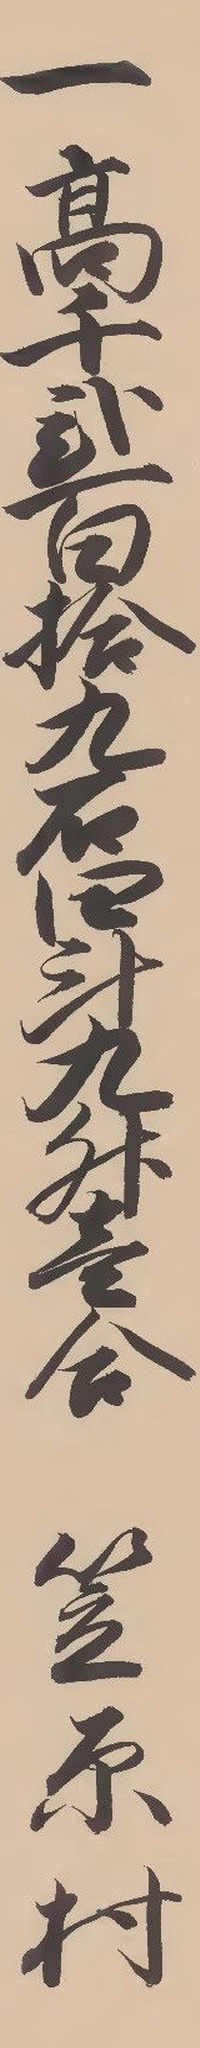一高千弐百拾九石四斗九升壱合笠原村
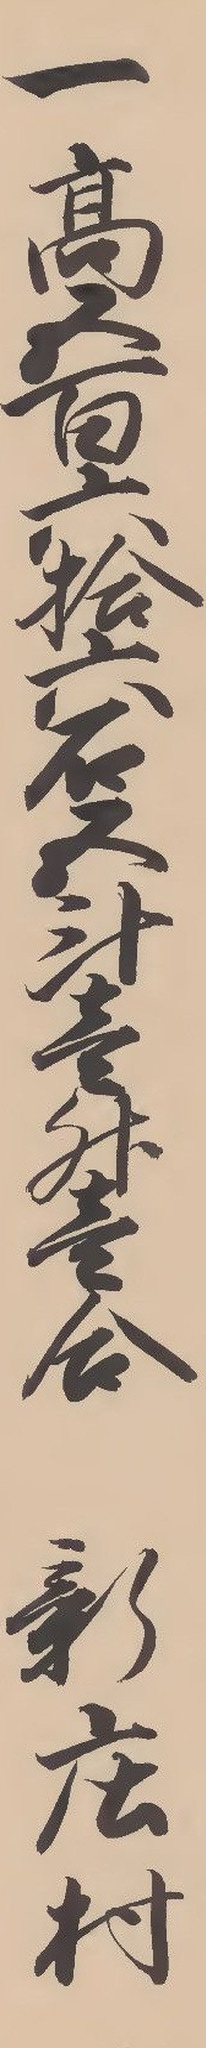一高五百六拾六石五斗壱升壱合新庄村
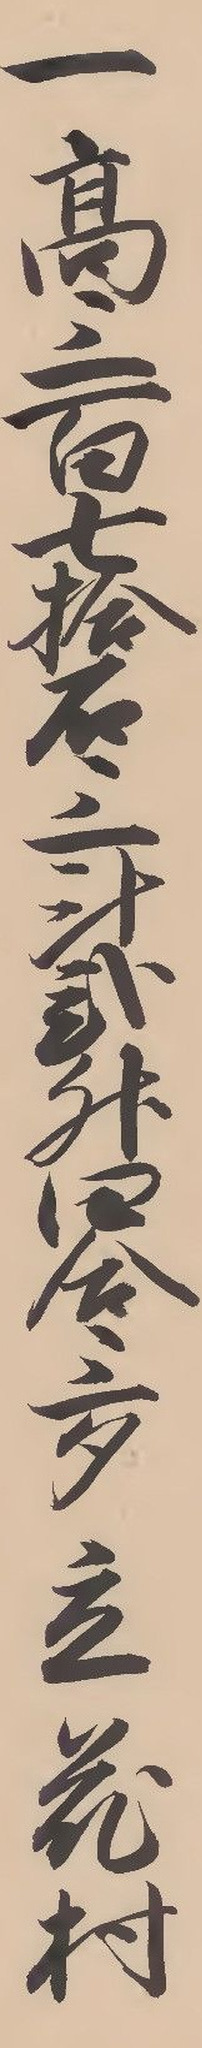一高三百七拾石三斗弐升四合三勺立花村

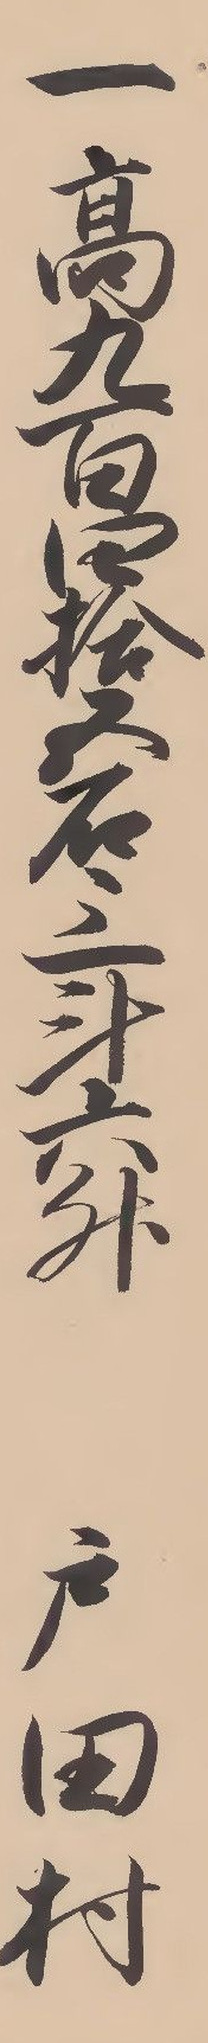一高九百四拾五石三斗六升戸田村
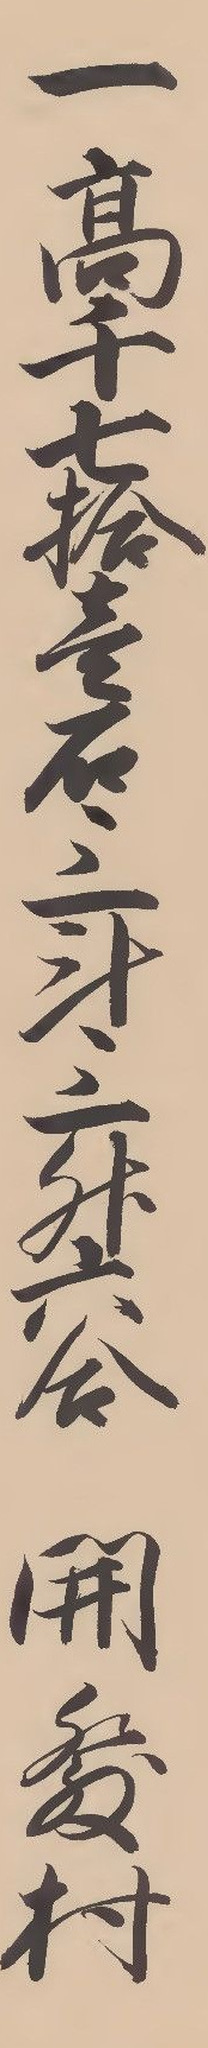一高千七拾壱石三斗三升六合開発村
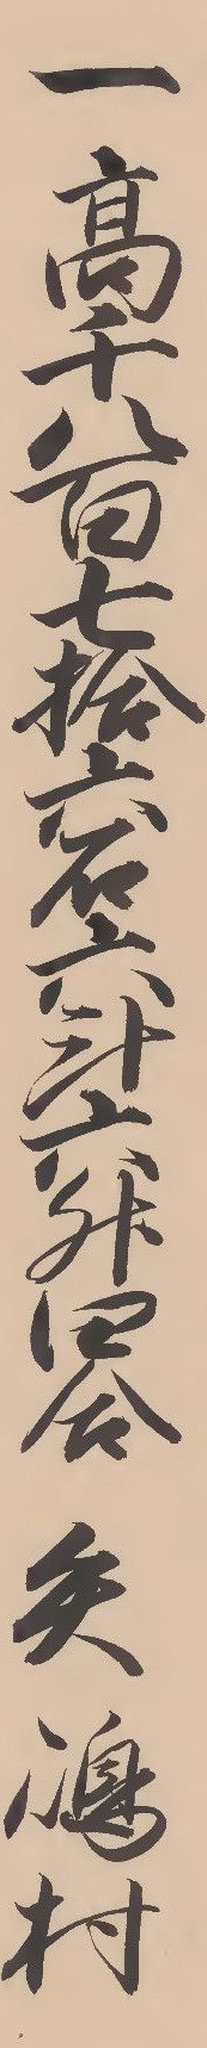一高千八百七拾六石六斗六升四合矢島村
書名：近江国郷帳
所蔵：国立公文書館 National Archives of Japan
